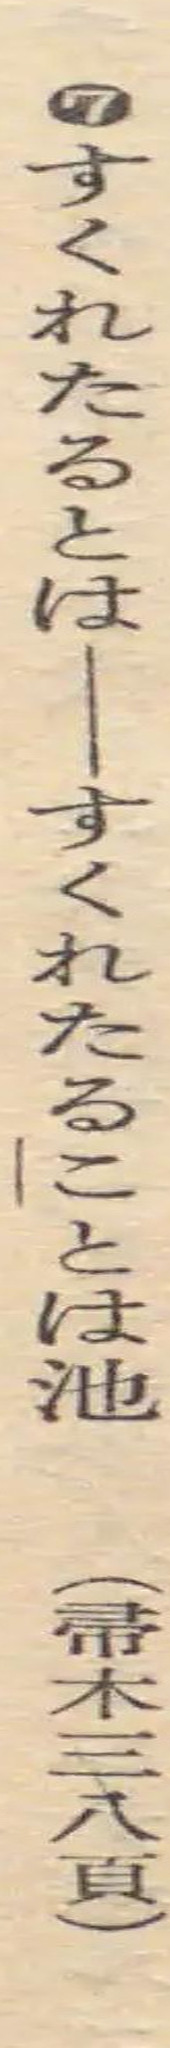❼すくれたるとは──すくれたることは池(帚木三八頁)
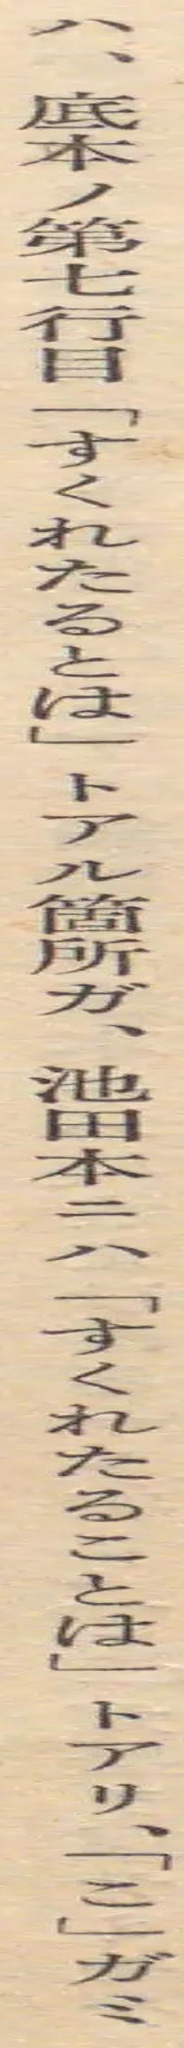ハ、底本ノ第七行目「すくれたるとは」トアル箇所ガ、池田本ニハ「すくれたることは」トアリ、「こ」ガミ
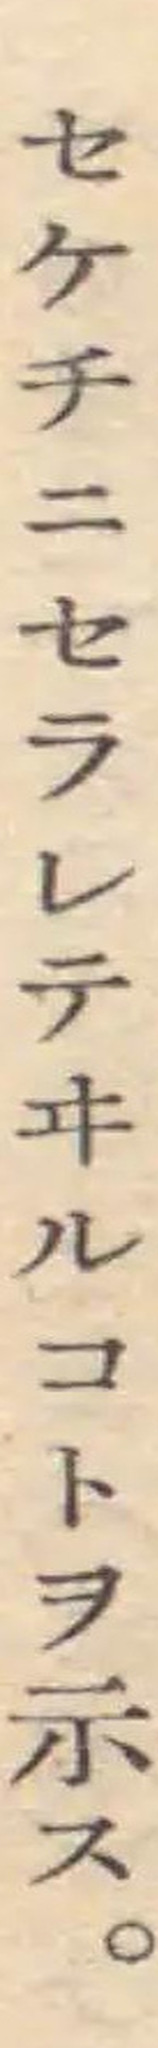セケチニセラレテヰルコトヲ示ス。
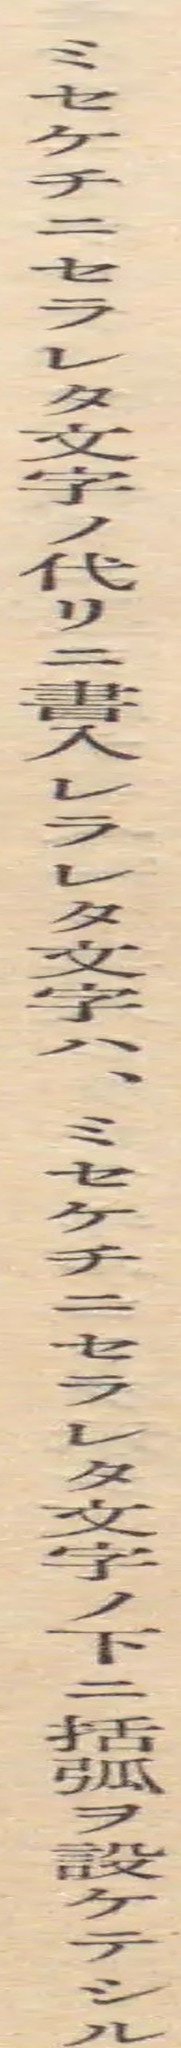ミセケチニセラレタ文字ノ代リニ書入レラレタ文字ハ、ミセケチニセラレタ文字ノ下ニ括弧ヲ設ケテシル
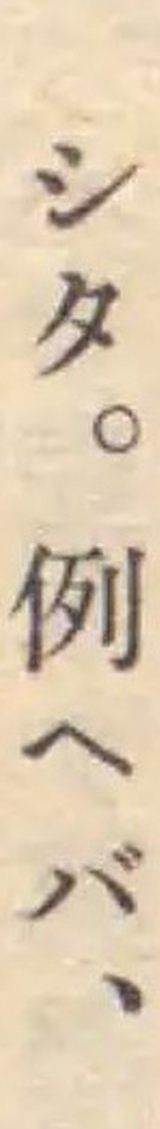シタ。例ヘバ、
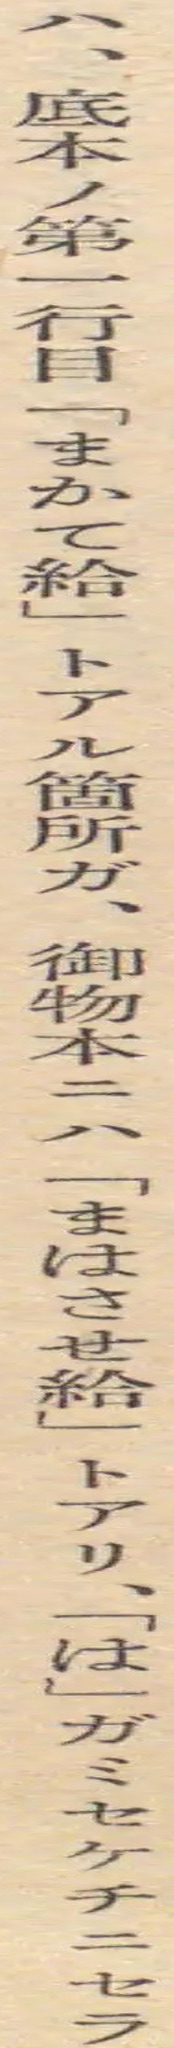ハ、底本ノ第一行目「まかて給」トアル箇所ガ、御物本ニハ「まはさせ給」トアリ、「は」ガミセケチニセラ
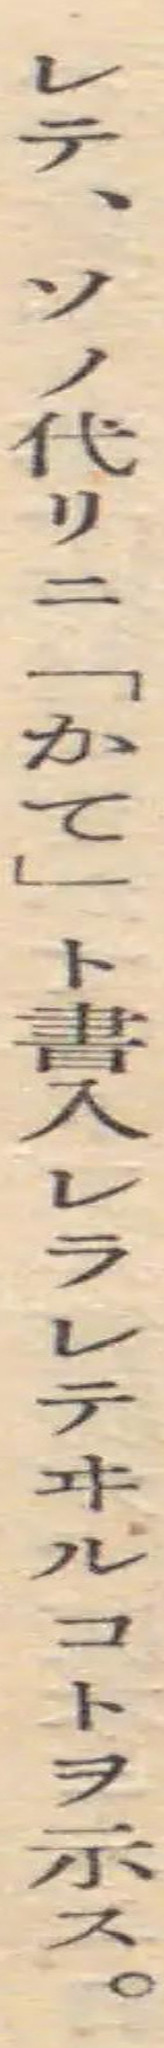レテ、ソノ代リニ「かて」ト書入レラレテヰルコトヲ示ス。
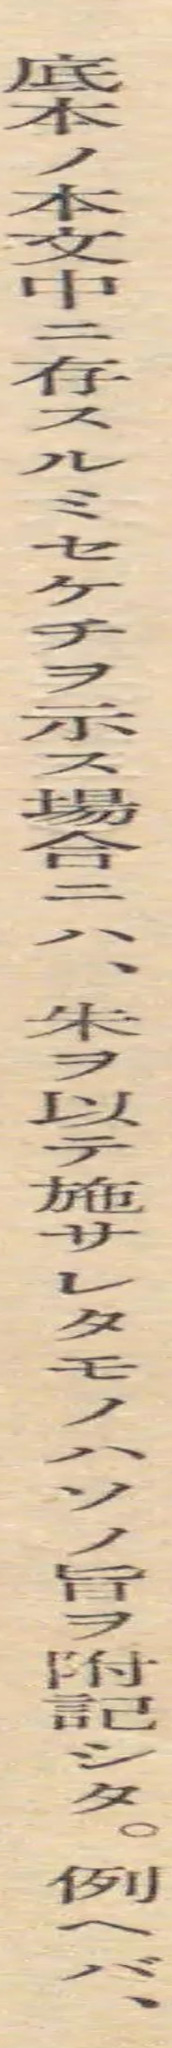一底本ノ本文中ニ存スルミセケチヲ示ス場合ニハ、朱ヲ以テ施サレタモノハソノ旨ヲ附記シタ。例ヘバ、

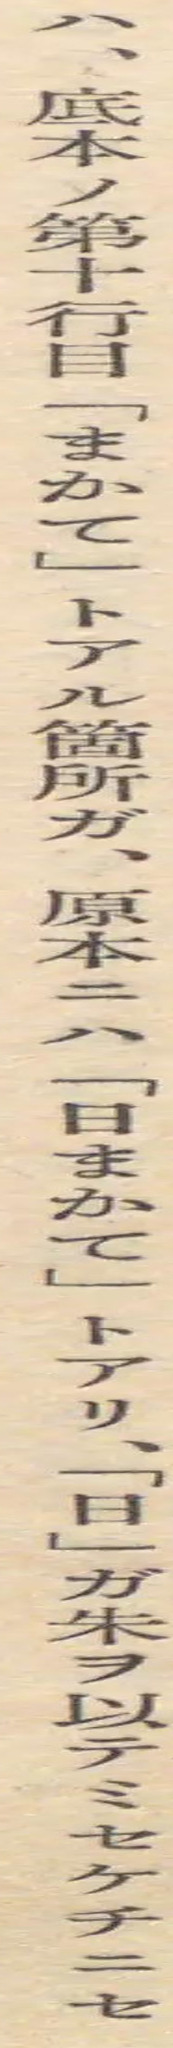ハ、底本ノ第十行目「まかて」トアル箇所ガ、原本ニハ「日まかて」トアリ、「日」ガ朱ヲ以テミセケチニセ
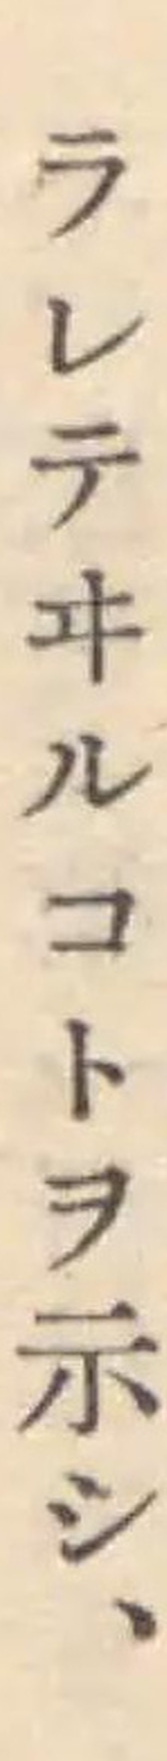ラレテヰルコトヲ示シ、
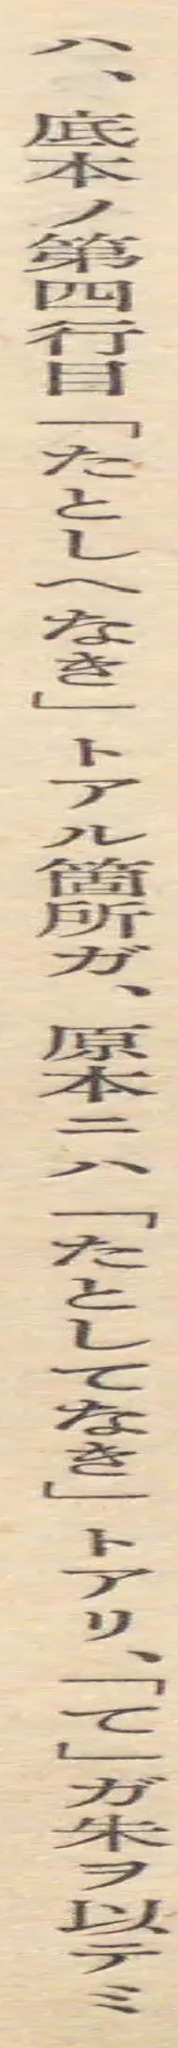ハ、底本ノ第四行目「たとしへなき」トアル箇所ガ、原本ニハ「たとしてなき」トアリ、「て」ガ朱ヲ以テミ
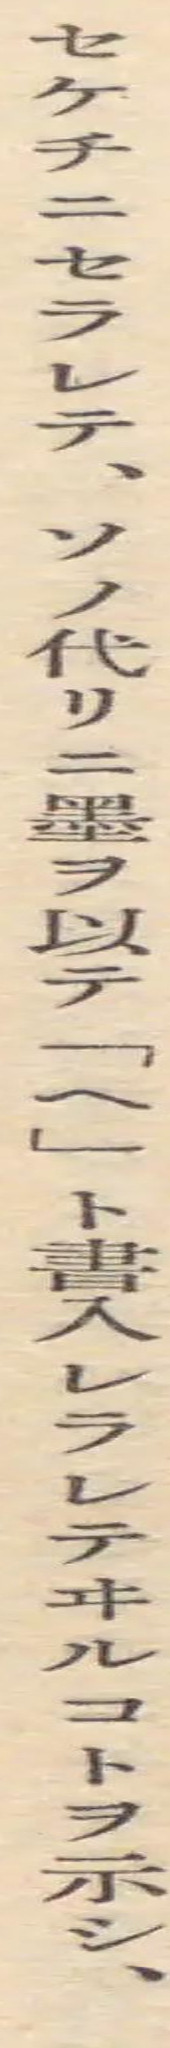セケチニセラレテ、ソノ代リニ墨ヲ以テ「へ」ト書入レラレテヰルコトヲ示シ、
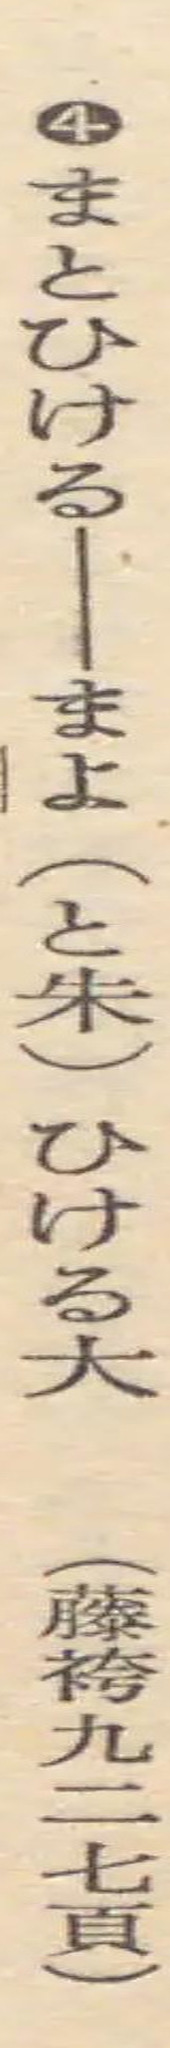❹まとひける──まよ(と朱)ひける大(藤袴九二七頁)
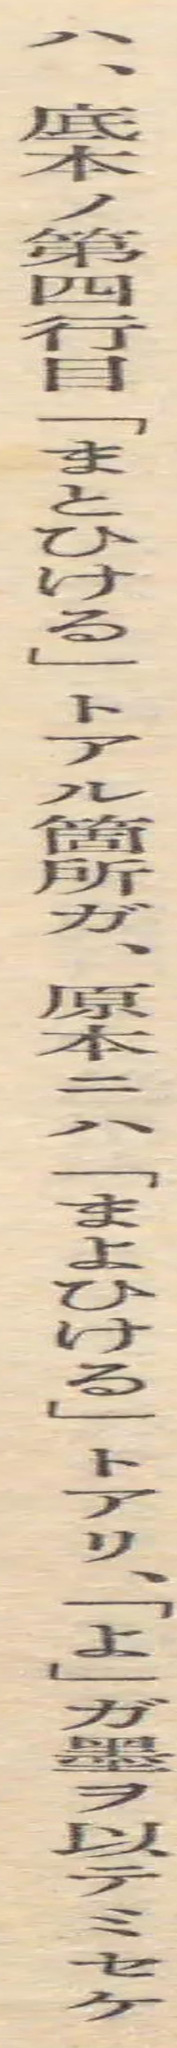ハ、底本ノ第四行目「まとひける」トアル箇所ガ、原本ニハ「まよひける」トアリ、「よ」ガ墨ヲ以テミセケ
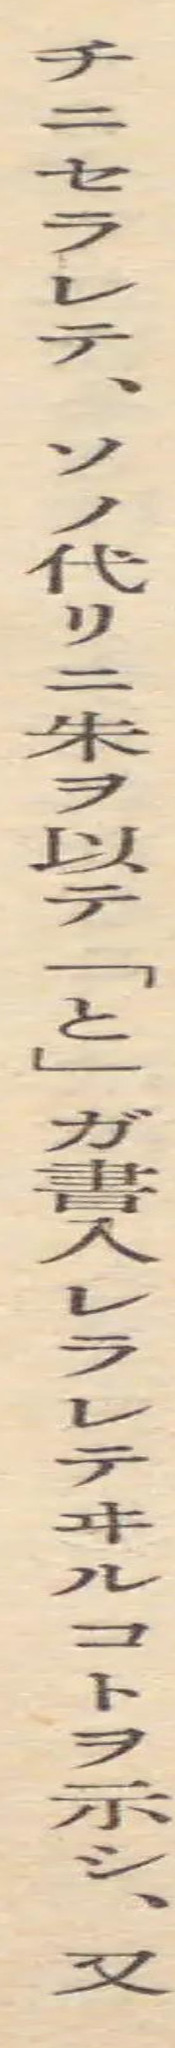チニセラレテ、ソノ代リニ朱ヲ以テ「と」ガ書入レラレテヰルコトヲ示シ、又
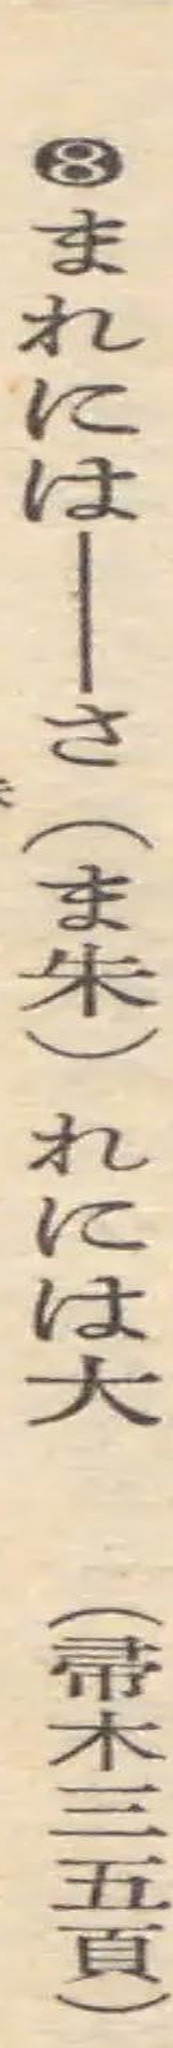❽まれには──さ(ま朱)れには大(箒木三五頁)
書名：校異源氏物語.
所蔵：国立国会図書館 National Diet Library, JAPAN
